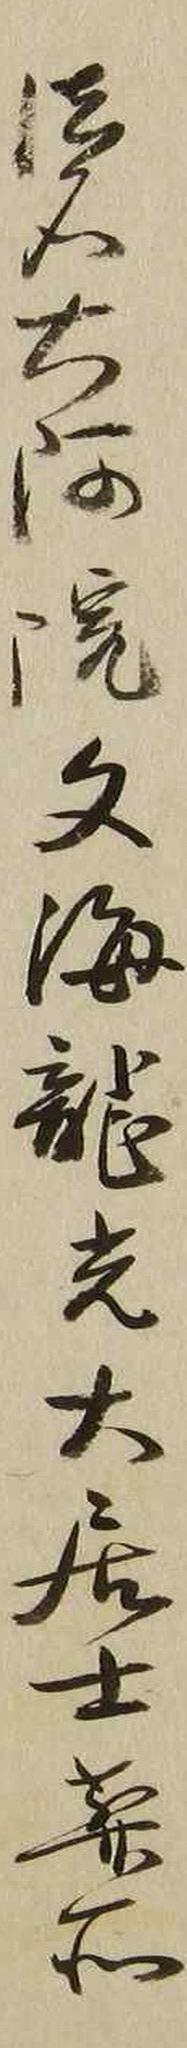法名大河院又海龍光大居士葬所
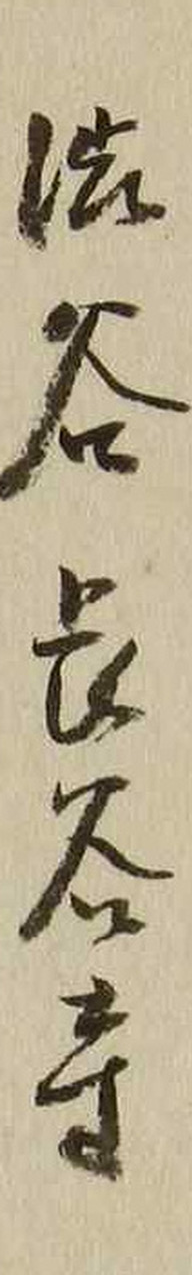渋谷長谷寺
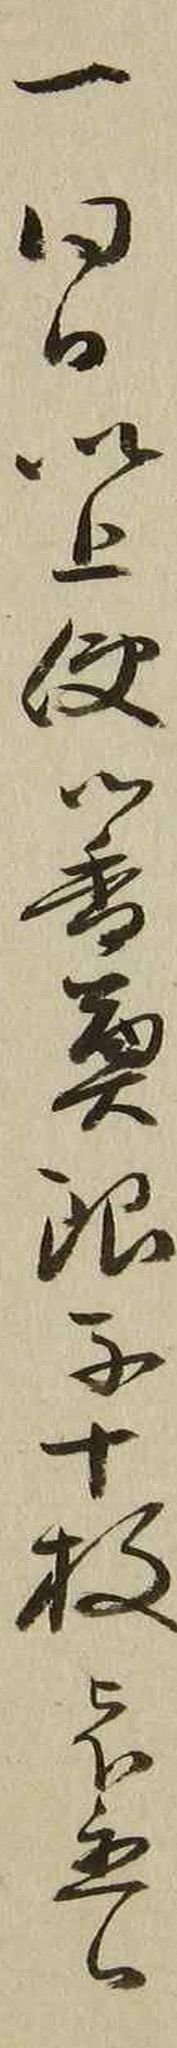一同日以上使御香典銀子十枚被下置候
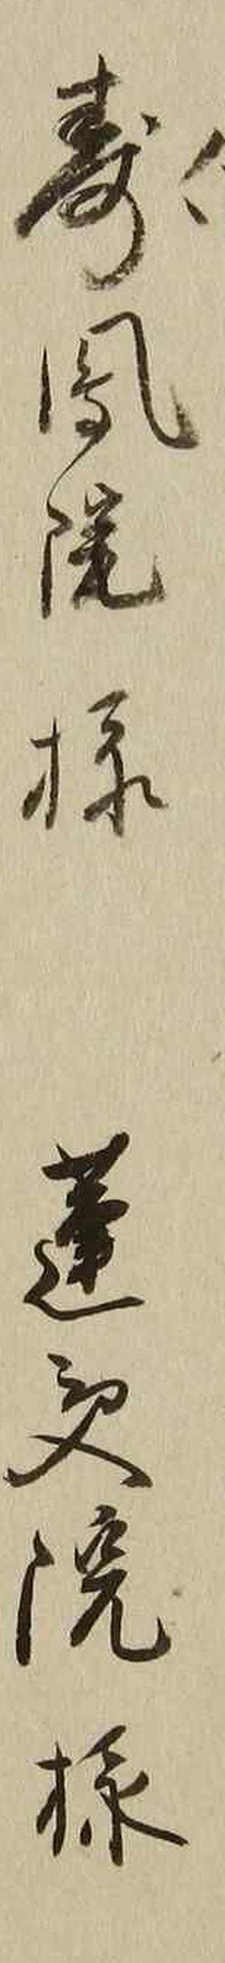寿鳳院様蓮更院様
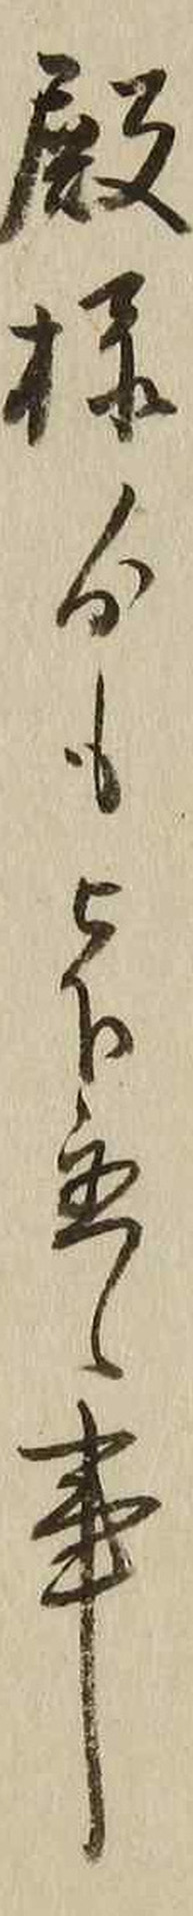殿様ゟも被下置候事
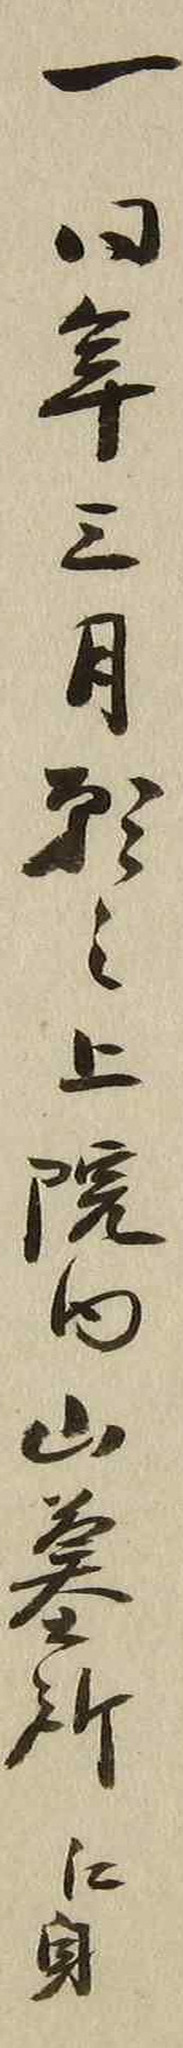一同年三月願之上院内山墓所江身
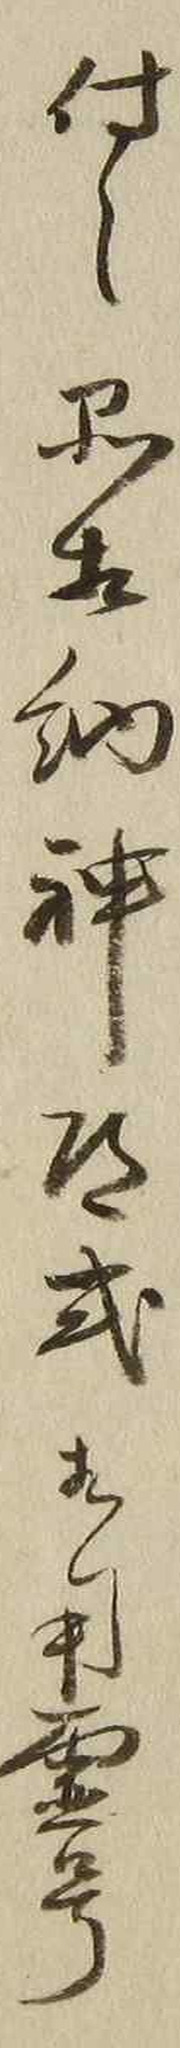付之品相納神道式相用霊号
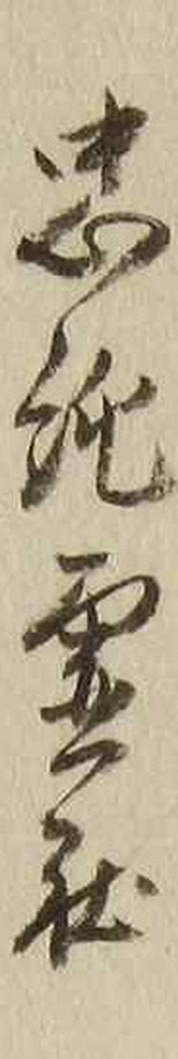忠純霊社
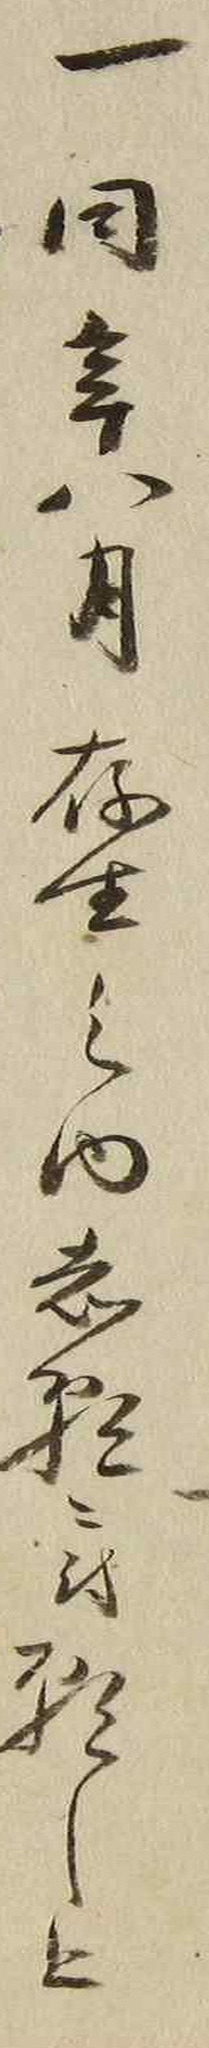一同年八月存生之内志願に付願之上
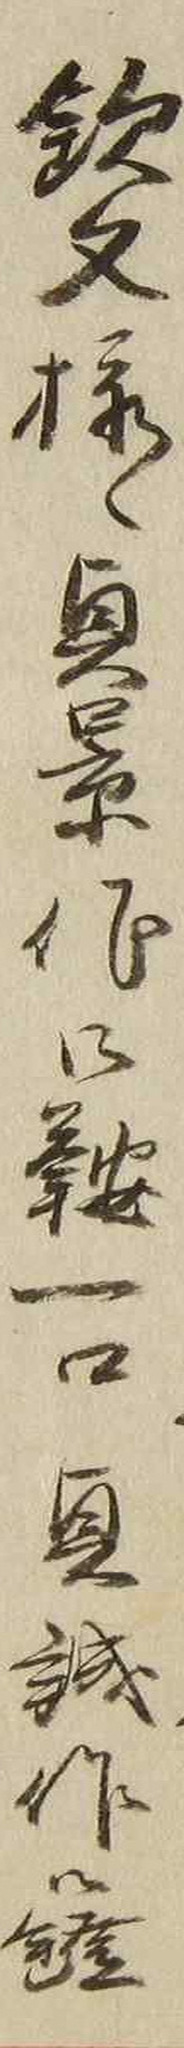欽文様へ貞景作御鞍一口貞誠作御鐙
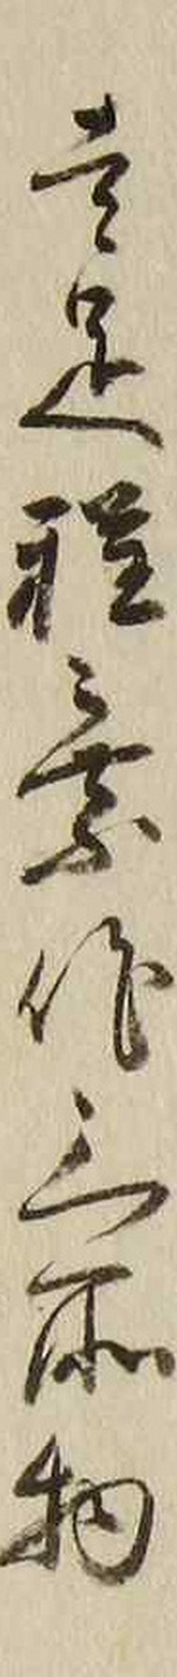壱足程乗作三所物
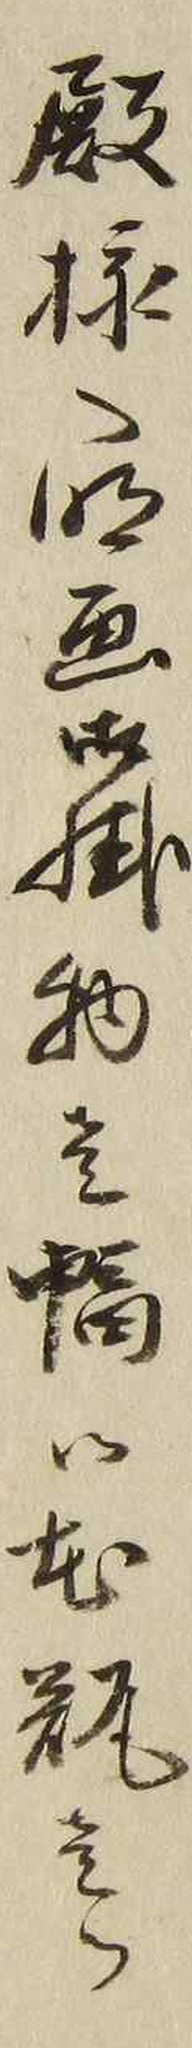殿様へ明画御掛物壱輻御花瓶壱つ
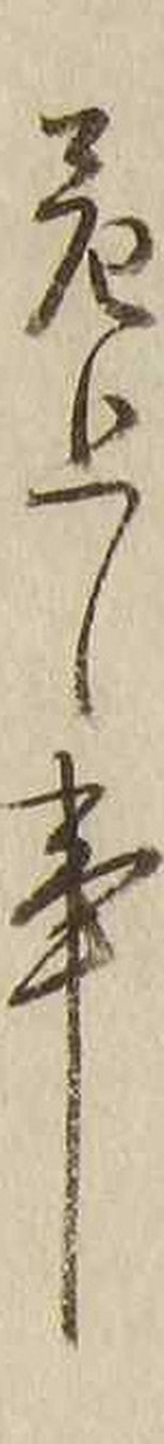差上候事

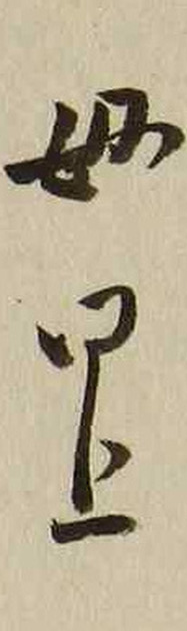母同上
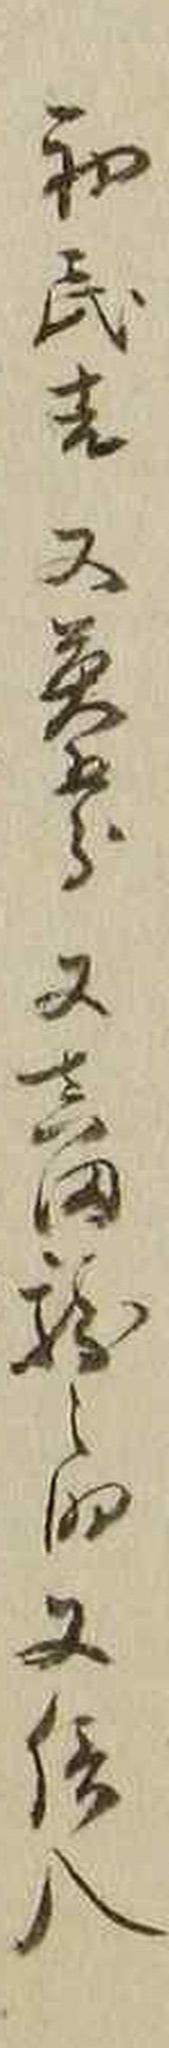初武吉又英五老又真田龍之助又俊八
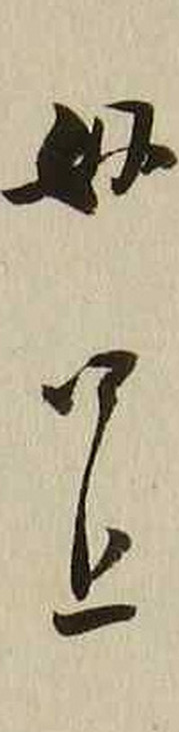母同上
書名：諸士系譜　巻之269　さ之部1
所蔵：会津若松市立会津図書館
